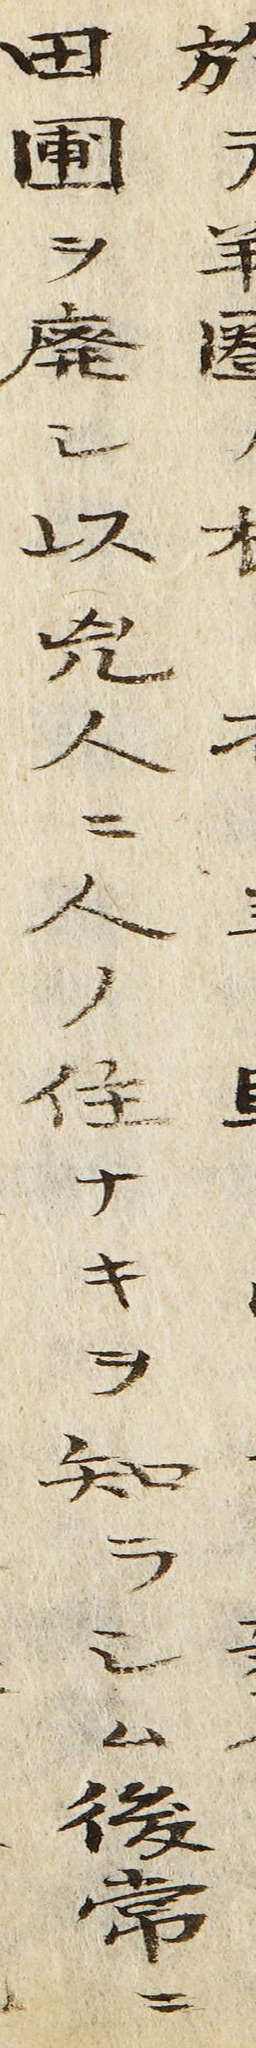田圃ヲ廃シ以兇人ニ人ノ住ナキヲ知ラシム後常ニ
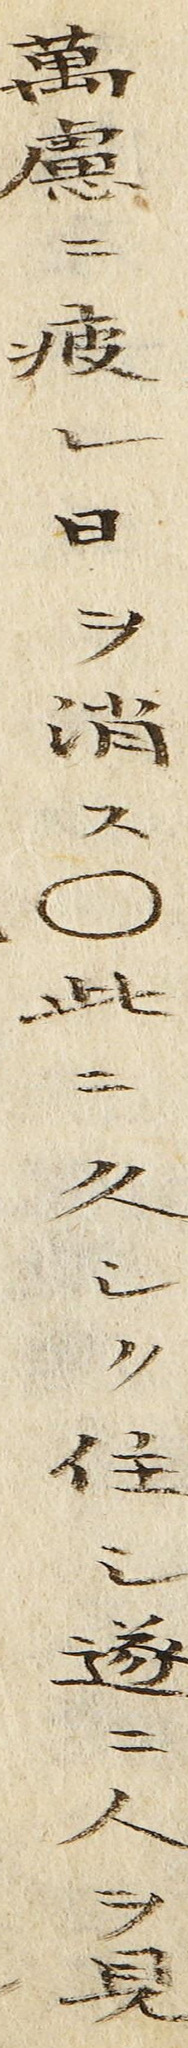萬慮ニ疲レ日ヲ消ス◯此ニ久シク住シ遂ニ人ヲ見
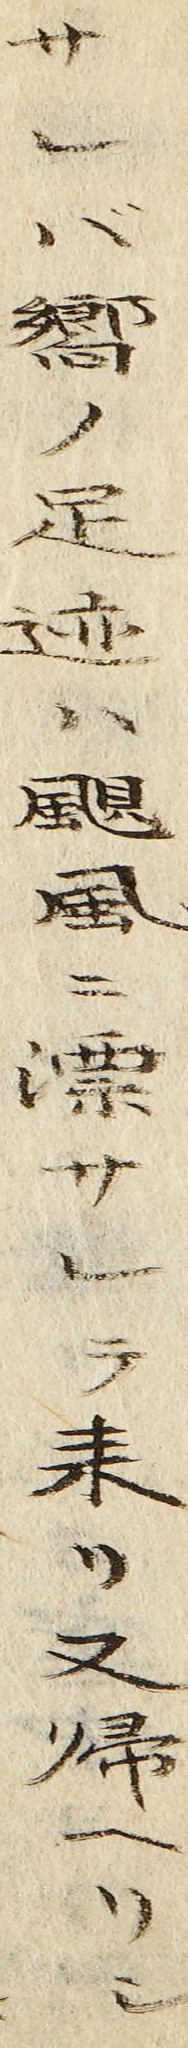サレハ嚮ノ足迹ハ颶風ニ漂サレテ来リ又帰ヘリシ
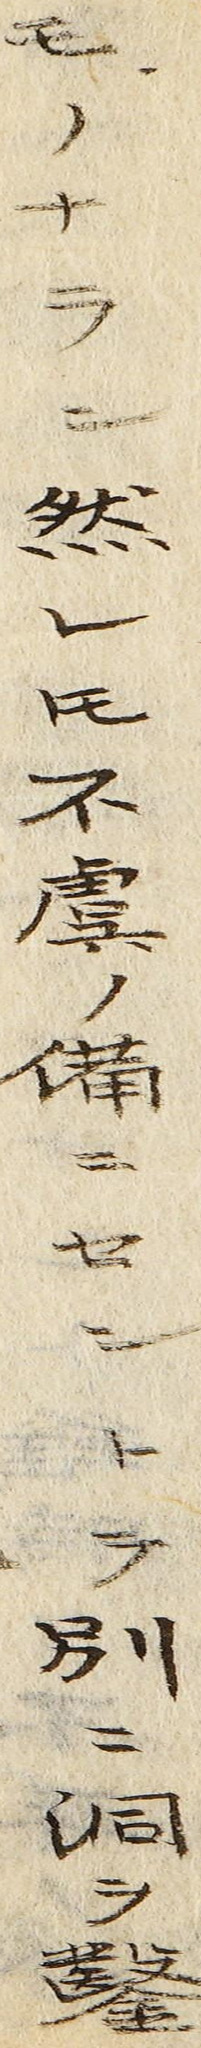モノナラン然レトモ不虞ノ備ニセントテ別ニ洞ヲ鑿
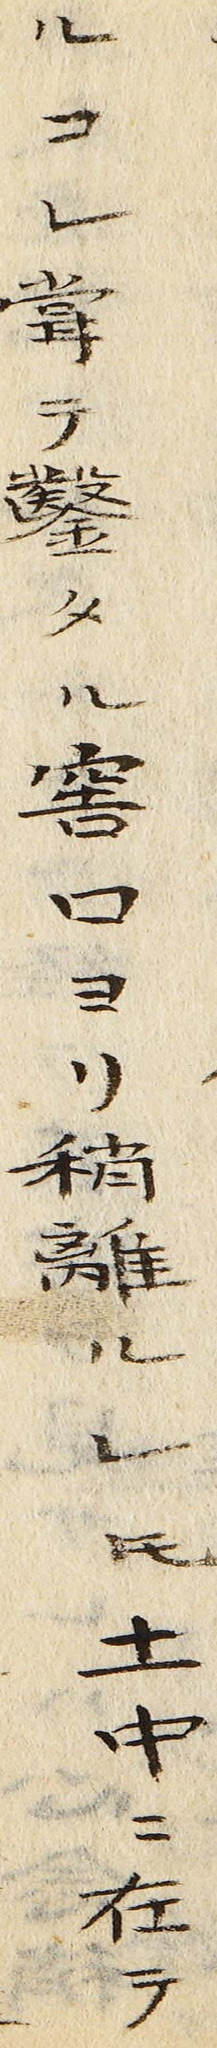ルコレ嘗テ鑿タル窖口ヨリ稍離ルレトモ土中ニ在テ
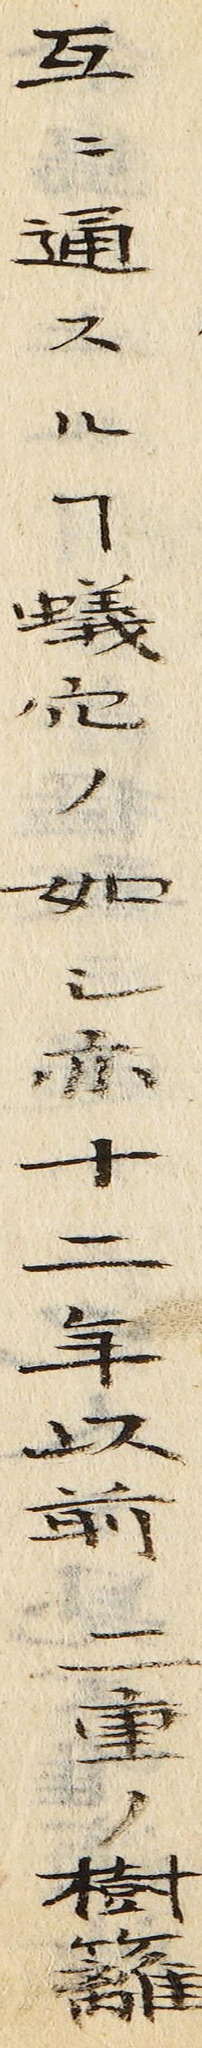互ニ通スルコト蟻穴ノ如シ亦十二年以前二重ノ樹籬
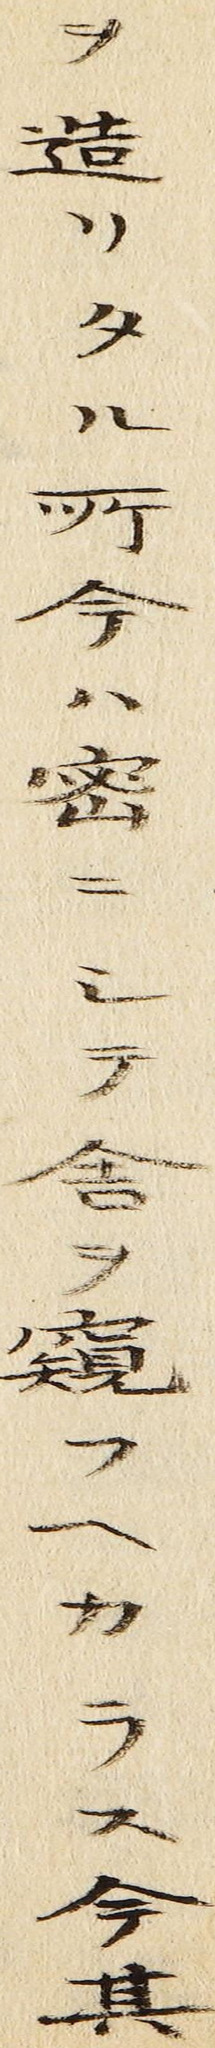ヲ造リタル所今ハ密ニシテ舎ヲ窺フヘカラス今其
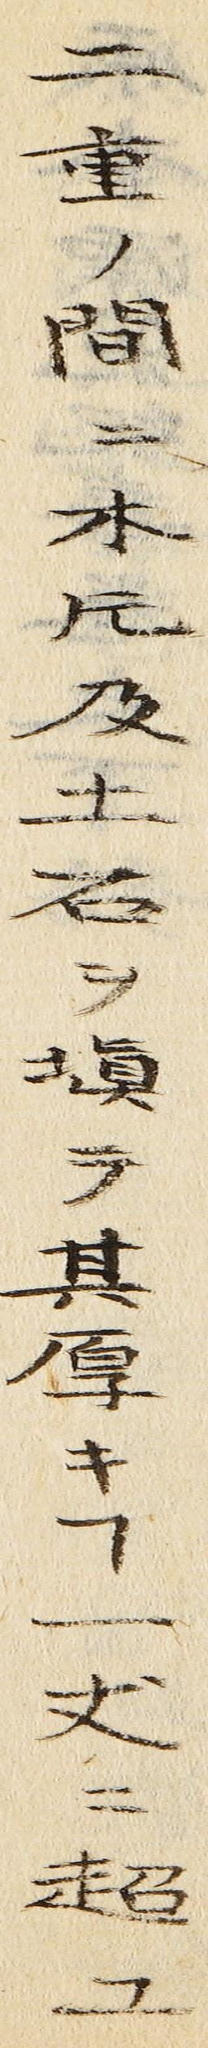二重ノ間ニ木片及土石ヲ填テ其厚キコト一丈ニ超ユ
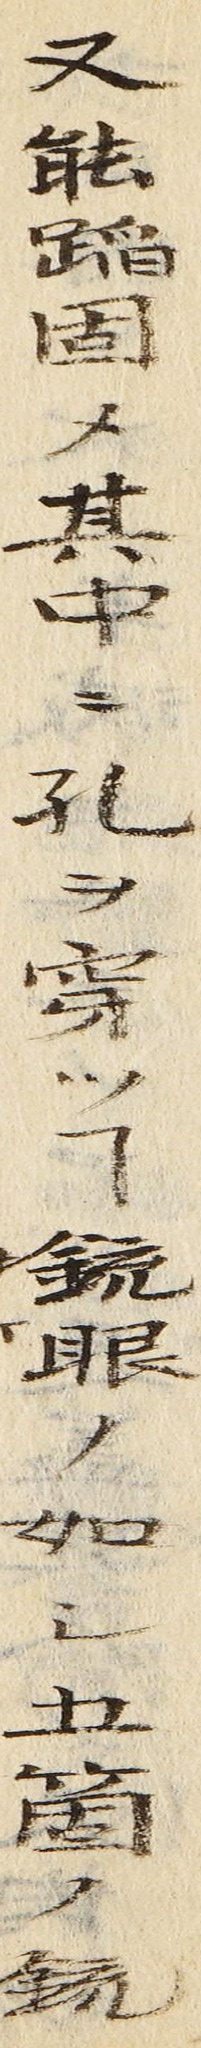又能蹈固メ其中ニ孔ヲ穿ツコト銃眼ノ如シ五箇ノ銃
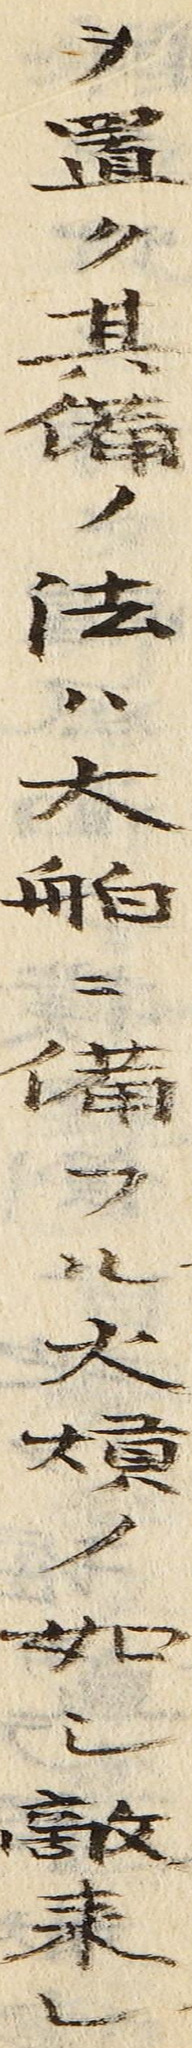ヲ置ク其備ノ法ハ大舶ニ備フル火熕ノ如シ敵来レ
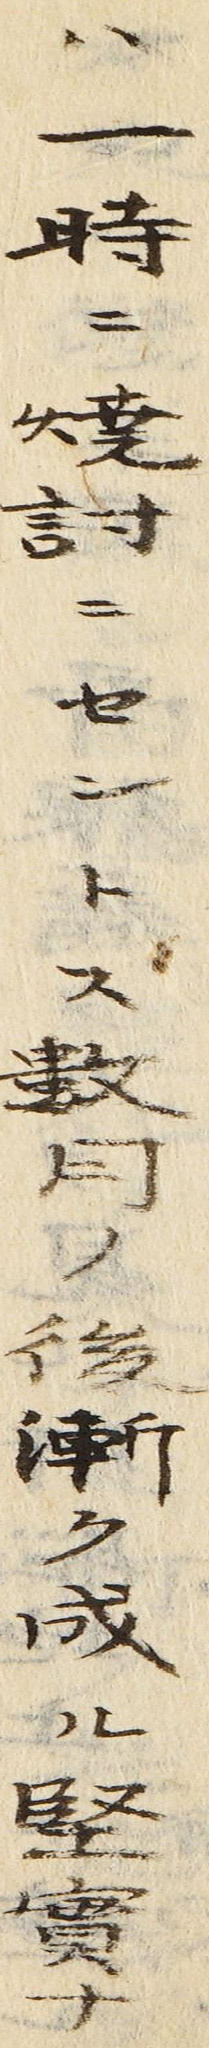ハ一時ニ焼討ニセントス数月ノ後漸ク成ル堅実ナ
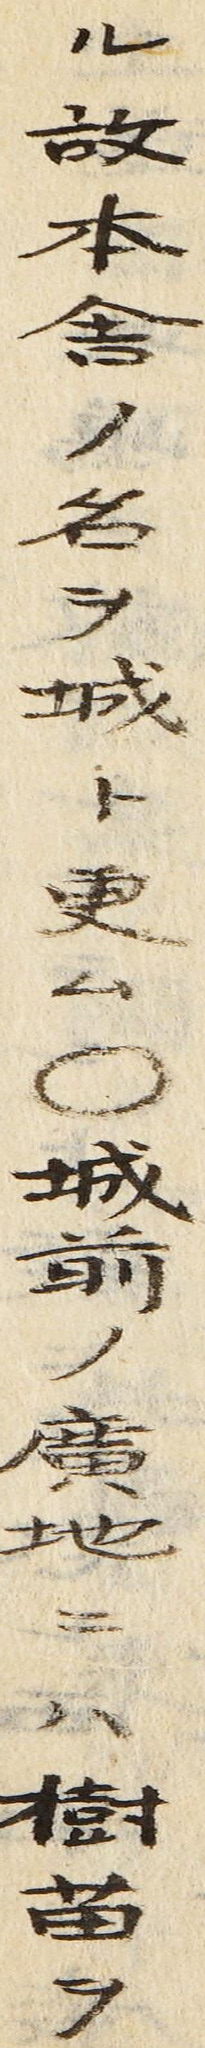ル故本舎ノ名ヲ城ト更ム◯城前ノ広地ニハ樹苗ヲ
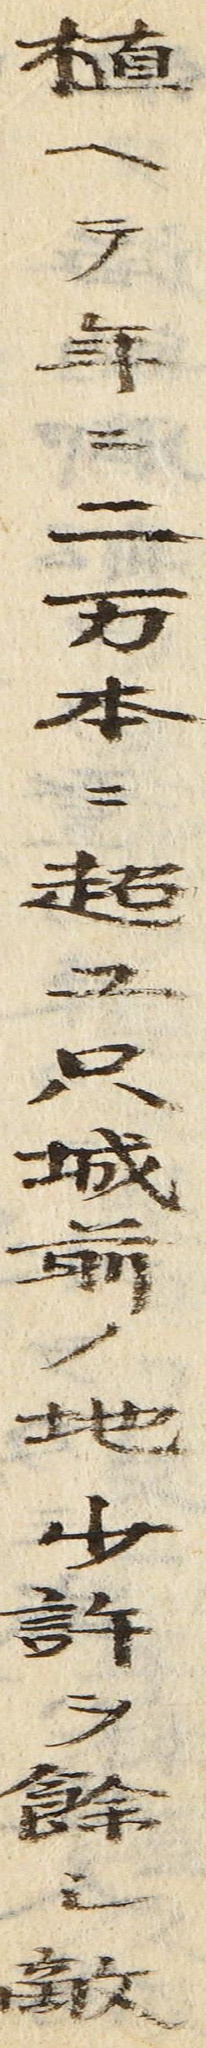植ヘテ年ニ二万本ニ超ユ只城前ノ地少許ヲ余シ敵
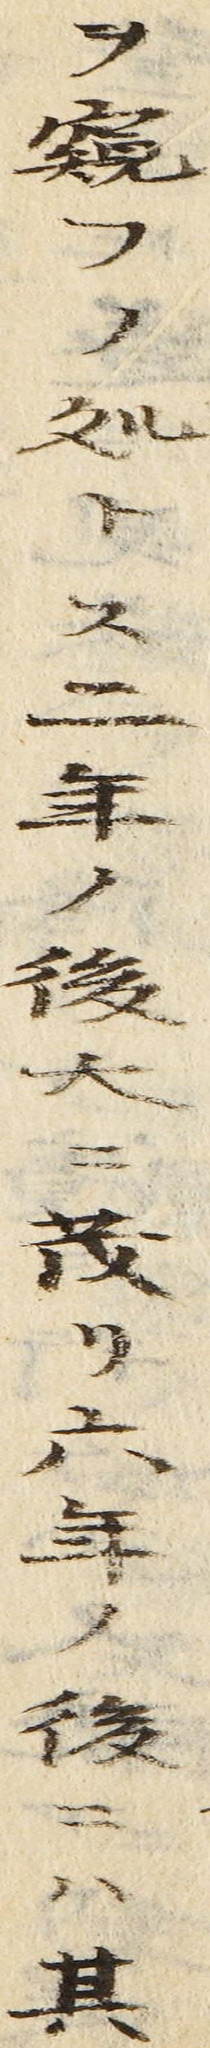ヲ窺フノ処トス二年ノ後大ニ茂リ六年ノ後ニハ其
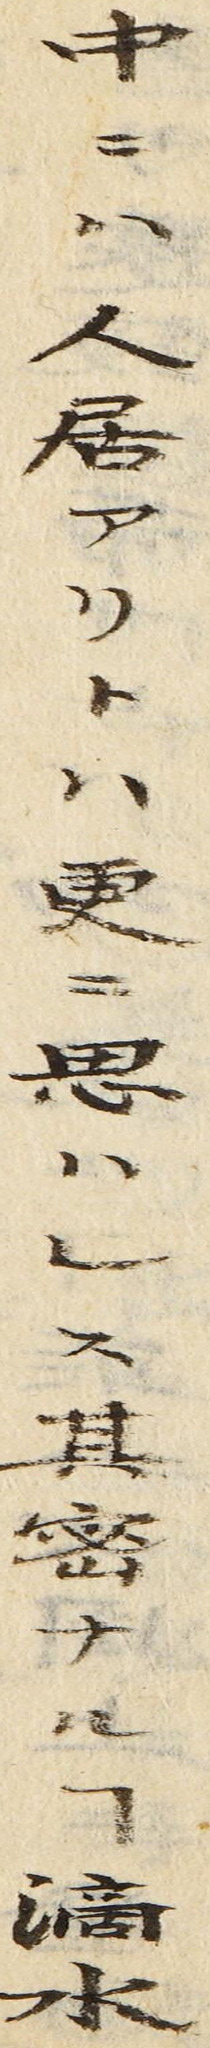中ニハ人居アリトハ更ニ思ハレス其密ナルコト滴水
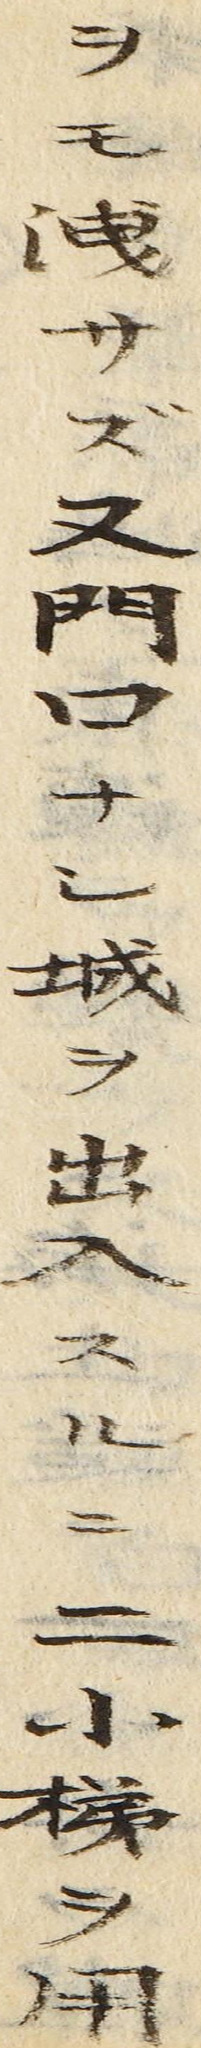ヲモ洩サズ又門口ナシ城ヲ出入スルニ二小梯ヲ用
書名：漂流紀事
